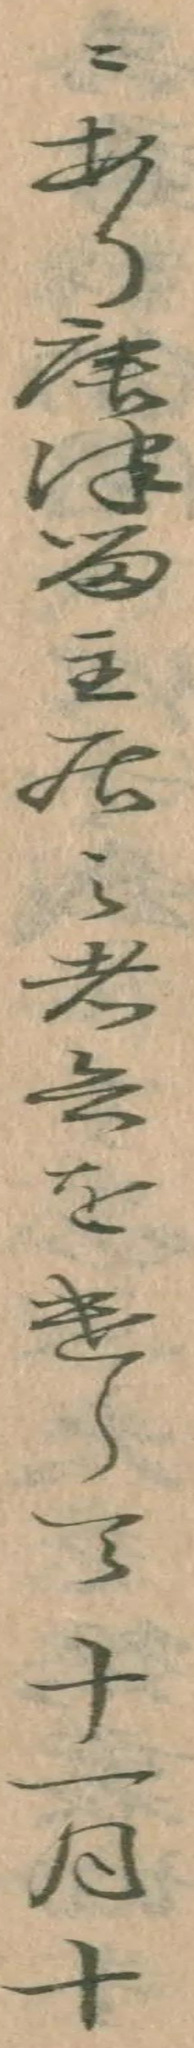にあり唐津留主居之者兵を遣して十一月十
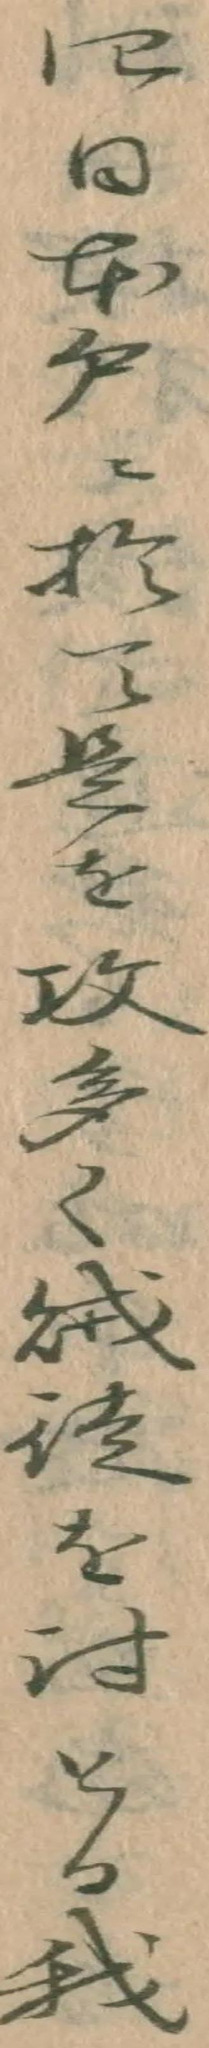四日本戸に於て是を攻多く賊徒を討とる我
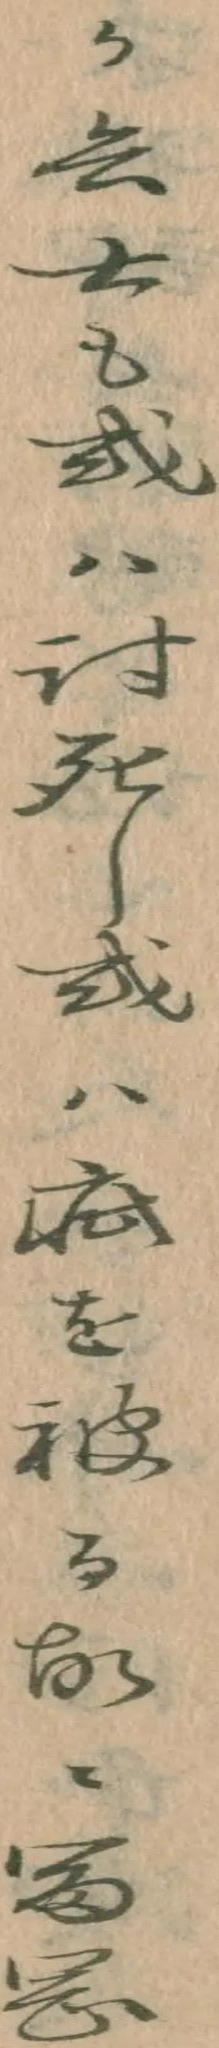か兵士も或は討死し或は疵を被る故に冨岡
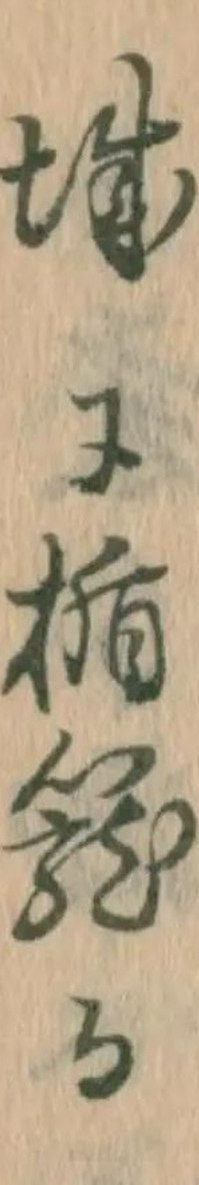城に楯籠る
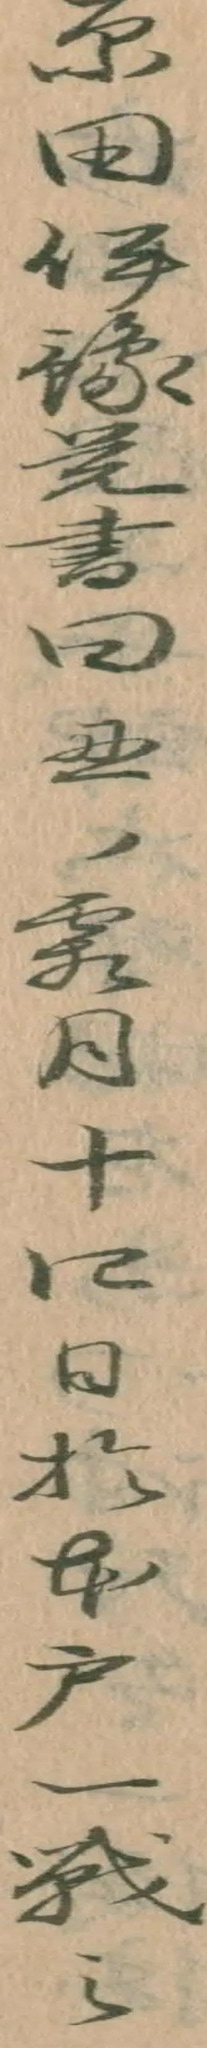原田伊予覚書曰丑之霜月十四日於本戸一戦之
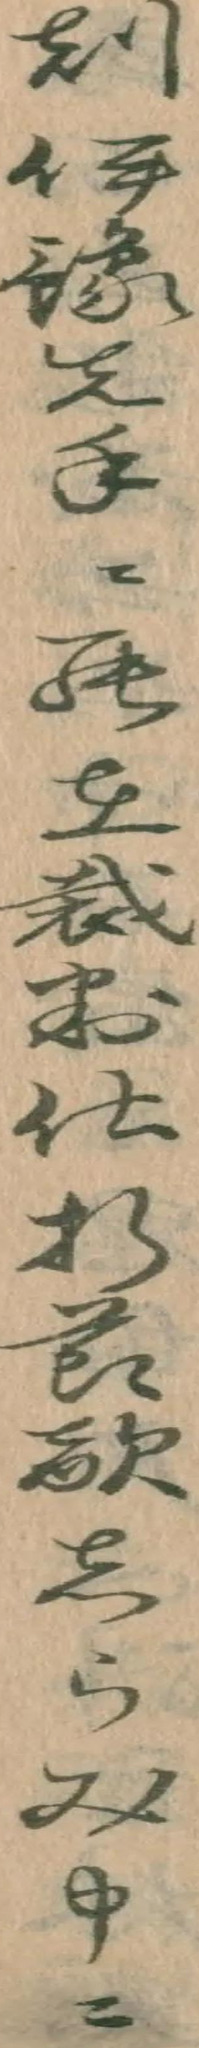刻伊予先手に罷在裁判仕折節敵者らみ申に
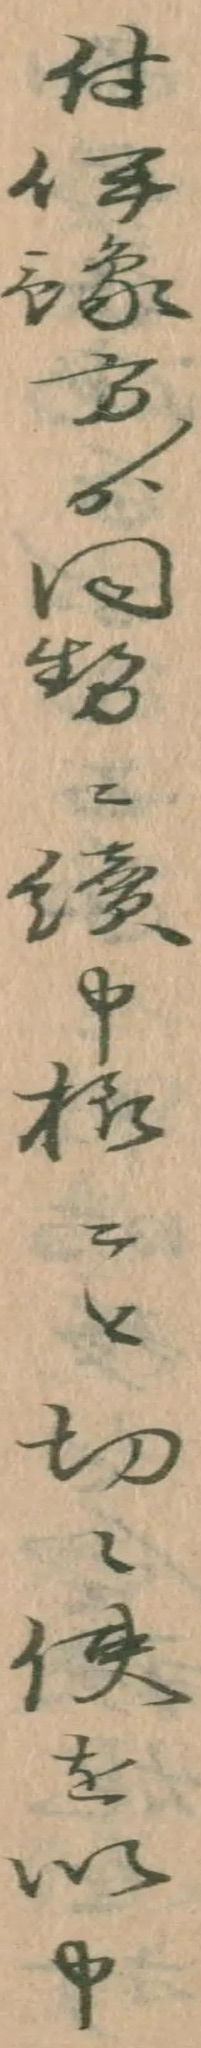付伊予方ゟ同勢に続申様にと切に使を以申
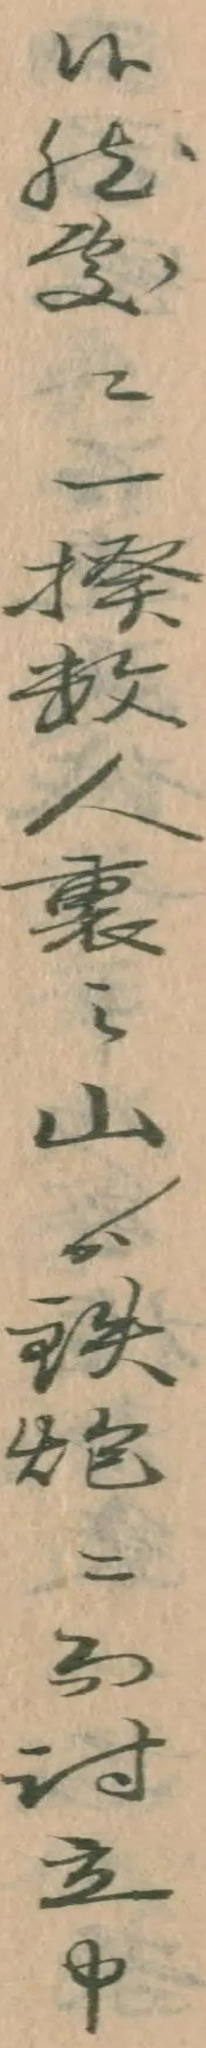候然處に一揆数人裏之山ゟ鉄炮に而討立申
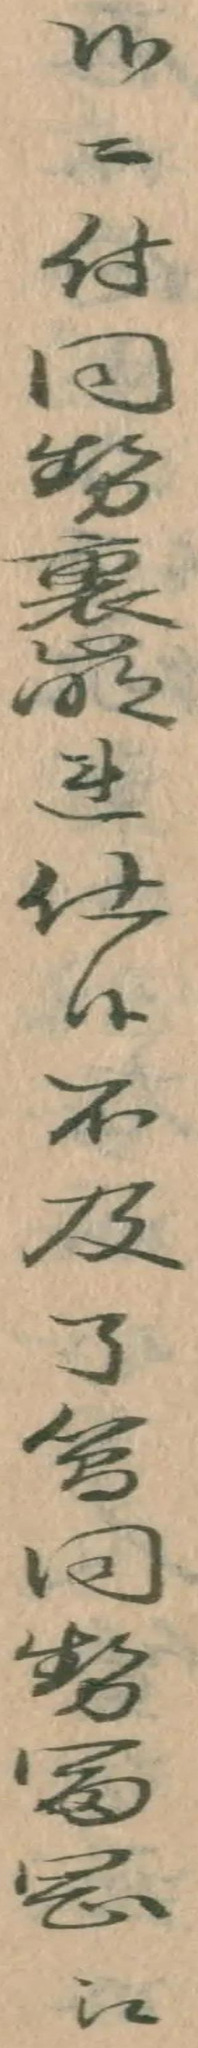候に付同勢裏崩連仕候不及了簡同勢冨岡江
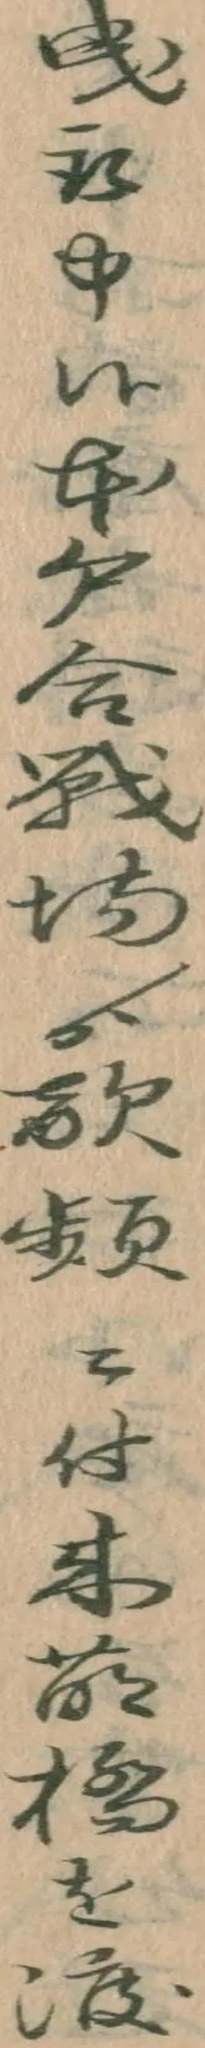曳取申候本戸合戦場ゟ敵頻に付来萌橋を渡
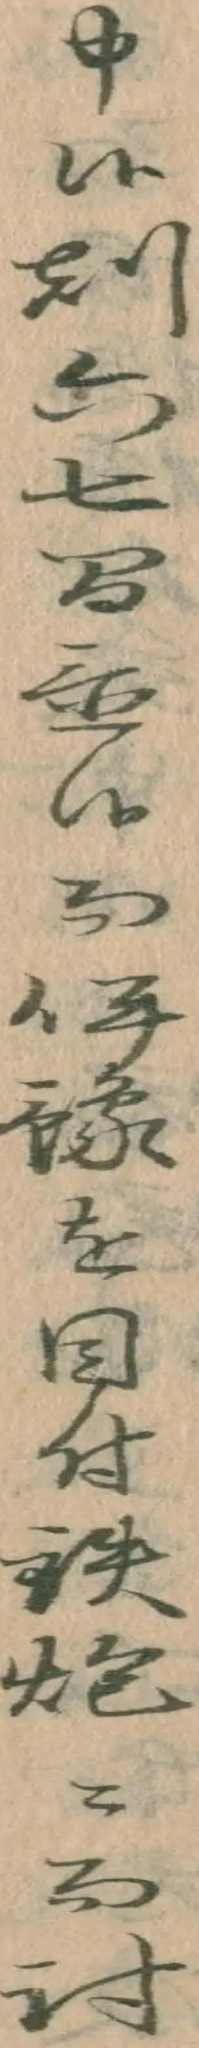申候刻六七間置候而伊予を目付鉄炮に而討
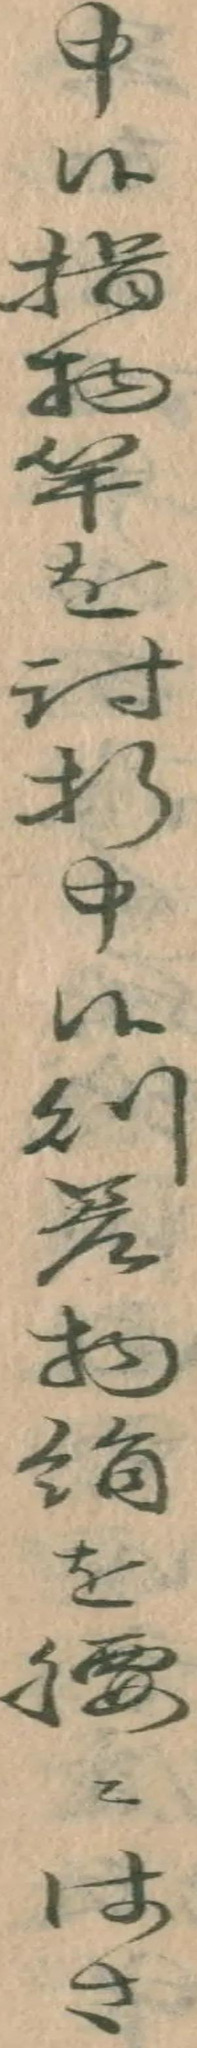申候指物竿を討折申候則差物絹を腰にはさ
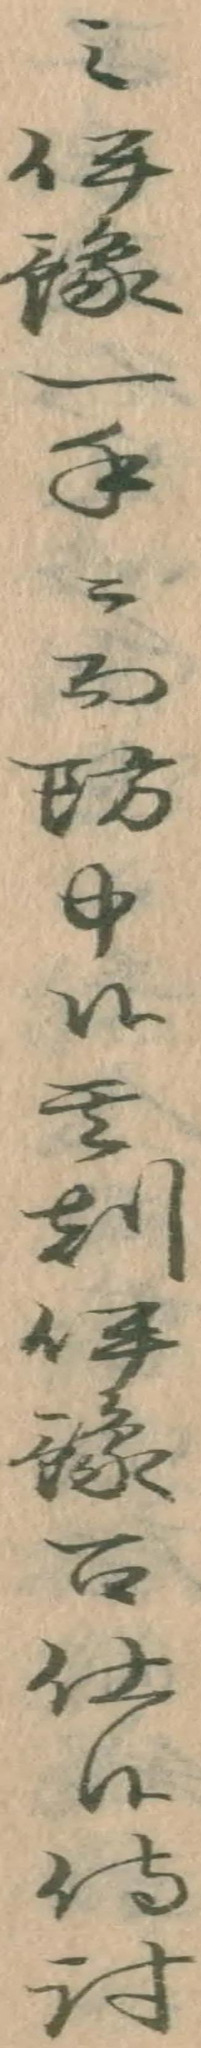み伊予一手に而防申候其刻伊予召仕候侍討
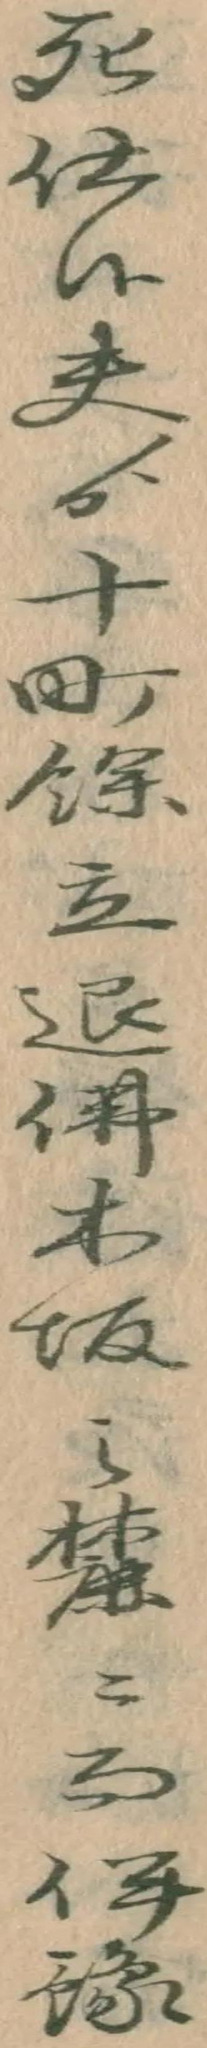死仕候夫ゟ十町余立退佛木坂之麓に而伊予
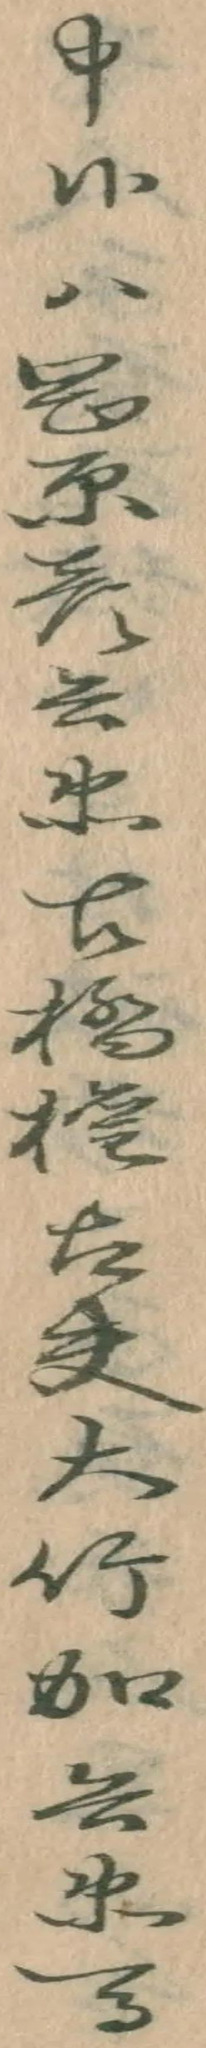申候は岡原彦兵衛古橋権太夫大竹加兵衛馬
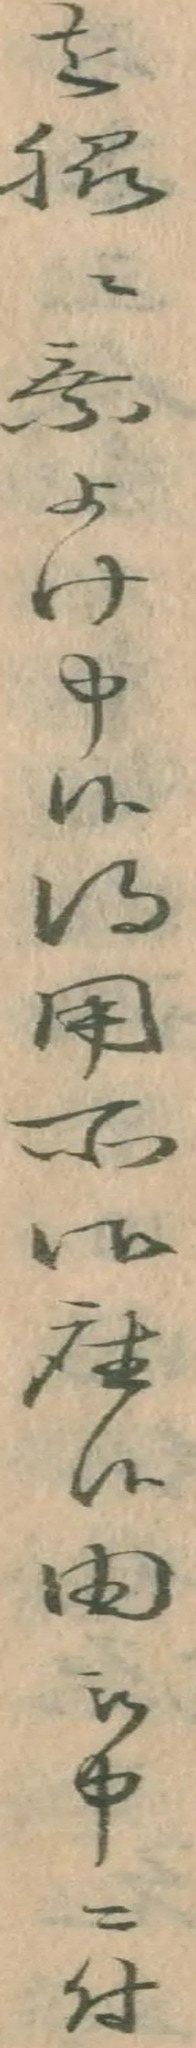を脇に乗よけ申候得用所御座候由被申に付
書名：切支丹御退治記 49巻. [2]
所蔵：国立国会図書館 National Diet Library, JAPAN
